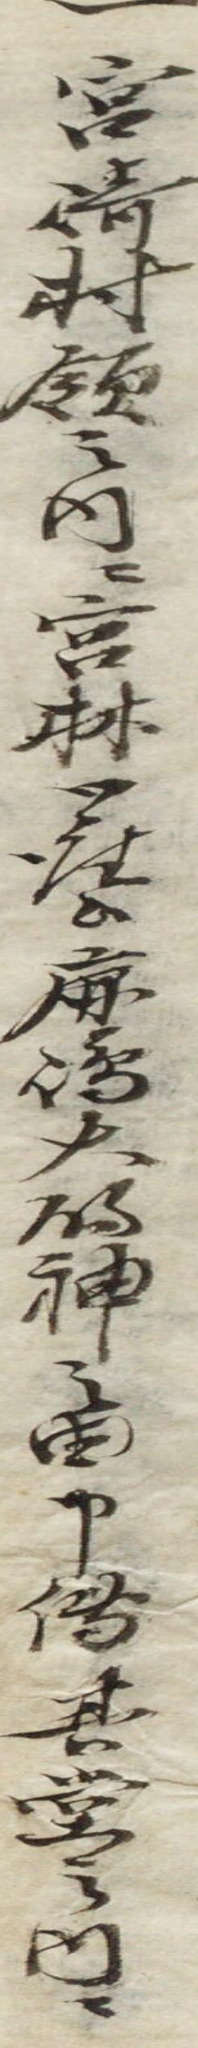一宮崎村領之内に宮林御座候鹿嶋大明神之由申伝其堂之内に
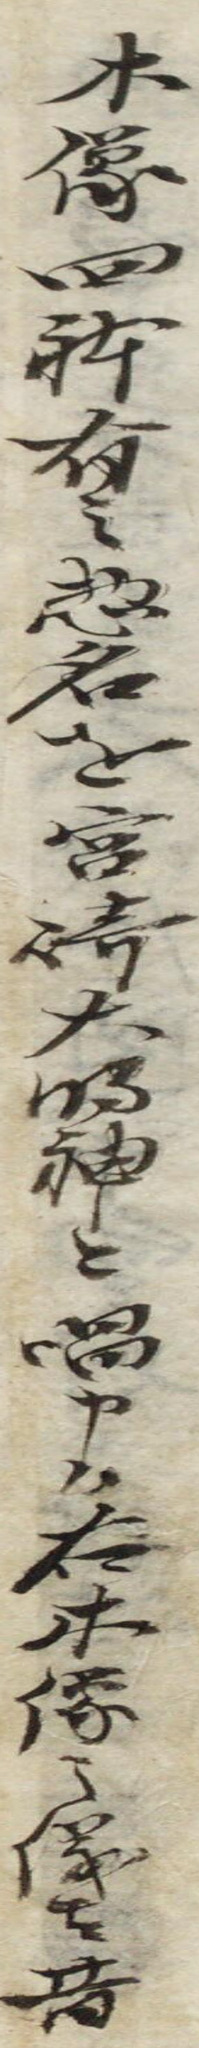木像四躰有之惣名を宮崎大明神と唱申候右木像之儀は昔
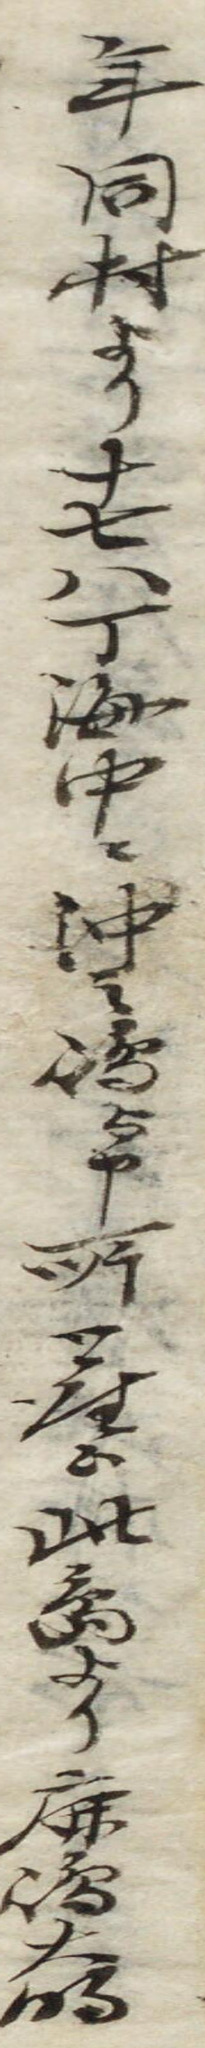年同村より十七八丁海中に沖之嶋与申所御座候此島より鹿嶋大明
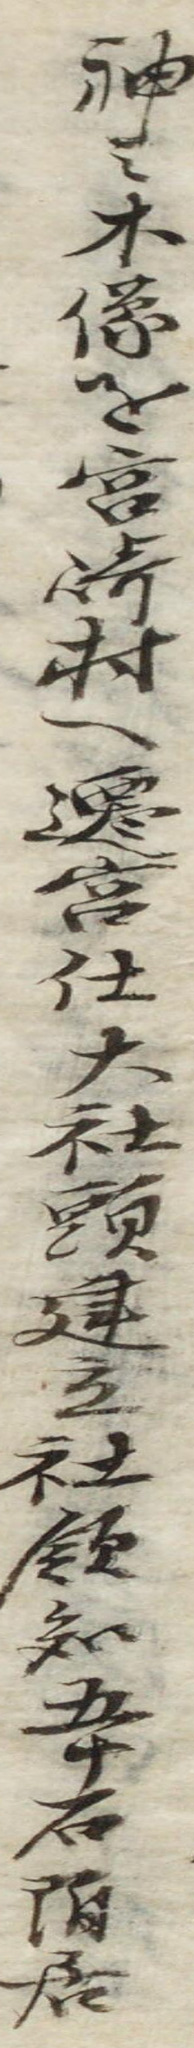神之木像を宮崎村へ遷宮仕大社頭建立社領知五十石附居
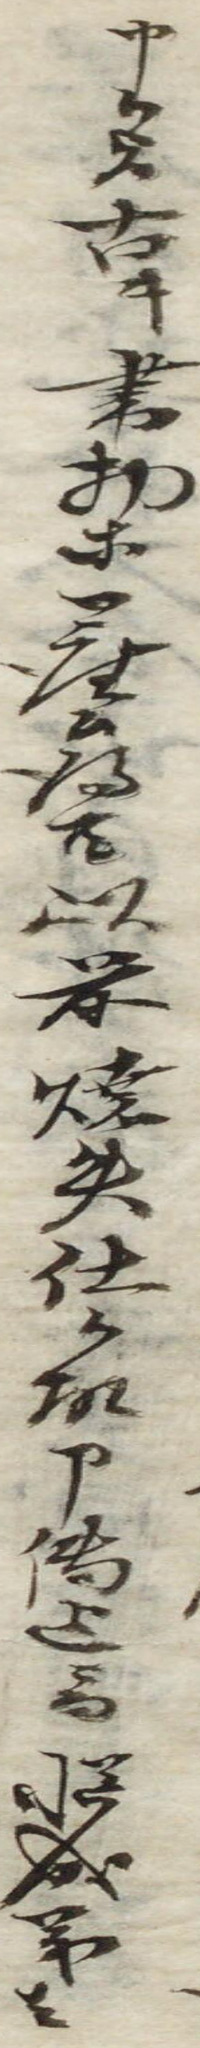申候は古き書物等御座候得共以前焼失仕候故申伝迄に而慥成義は
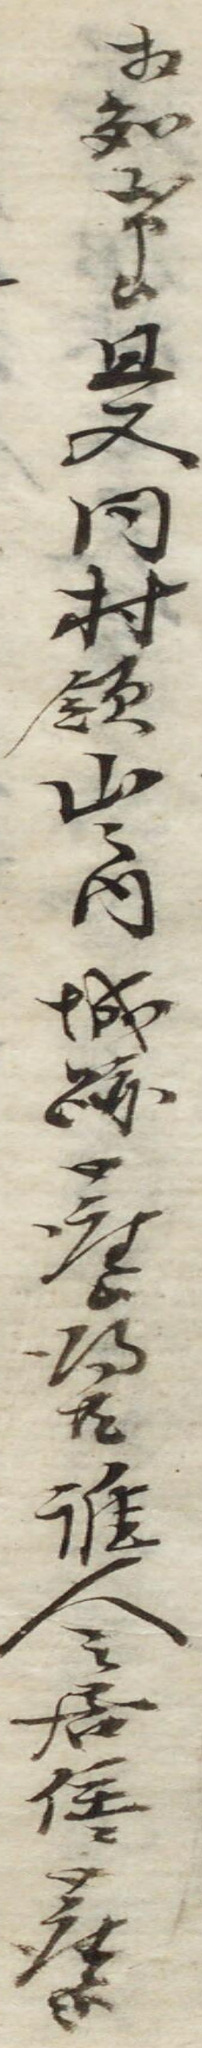相知不申候且又同村領山之内城跡御座候得共誰人之居住に御座候
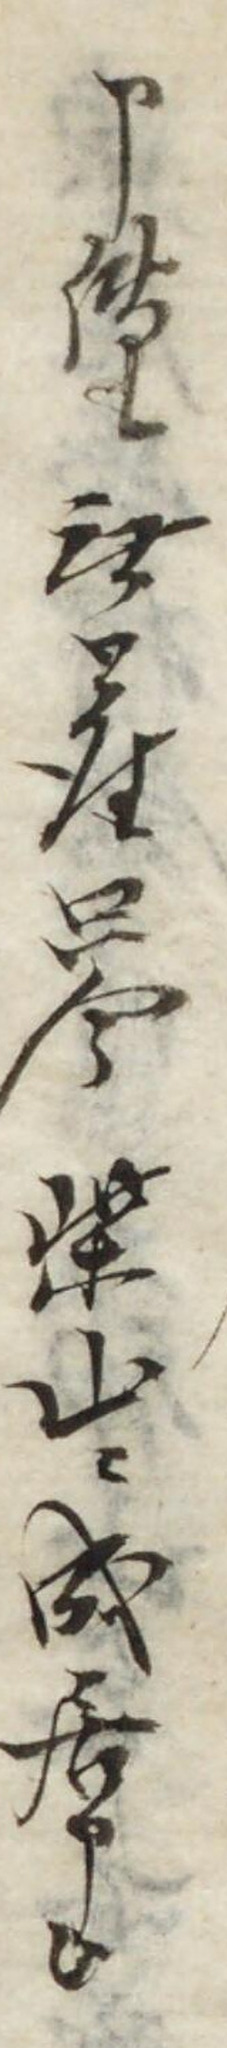申伝も無御座只今柴山に成居申候
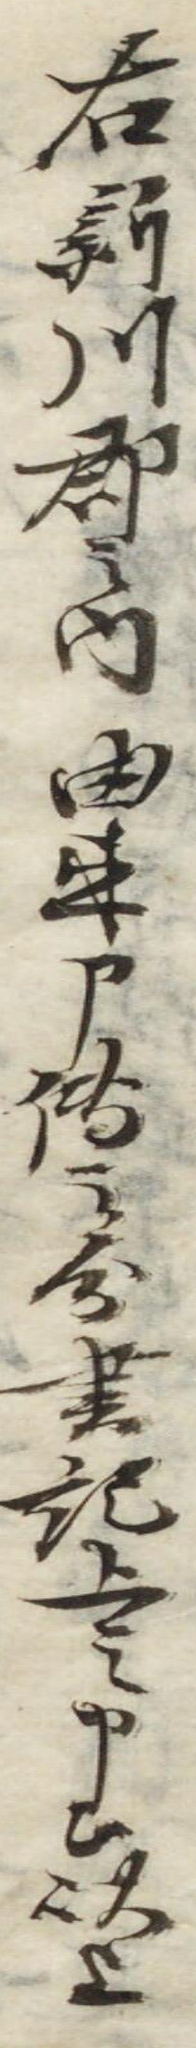右新川郡之内由来申伝之分書記上之申候以上

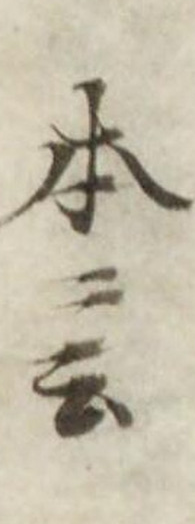本ニ云
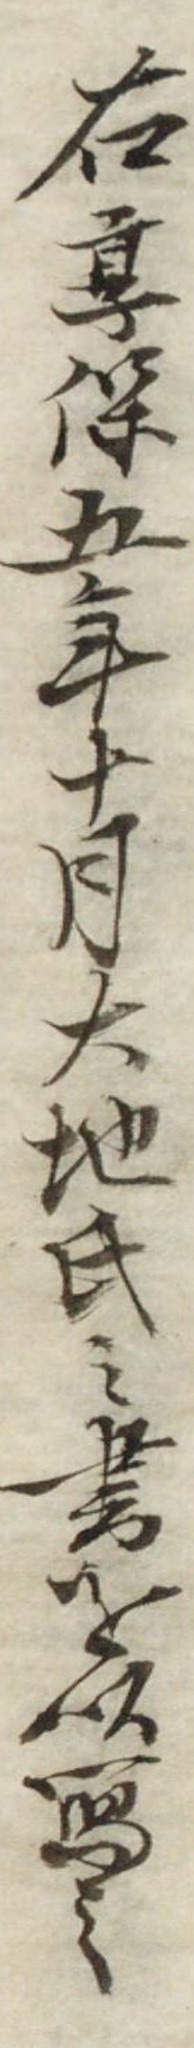右享保五年十月大地氏之書を以写之
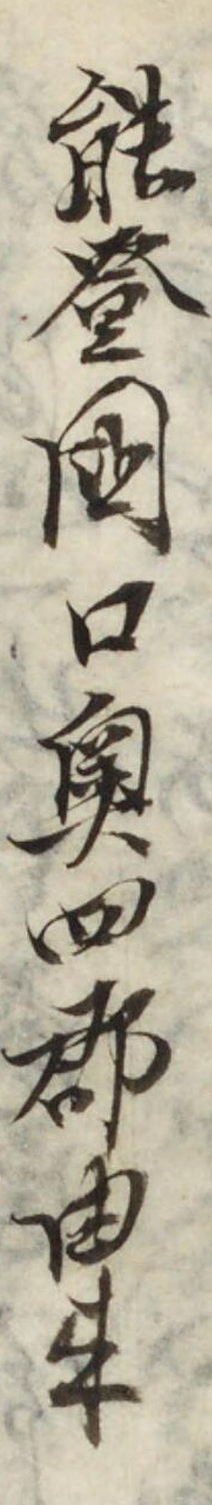能登国口奥四郡由来
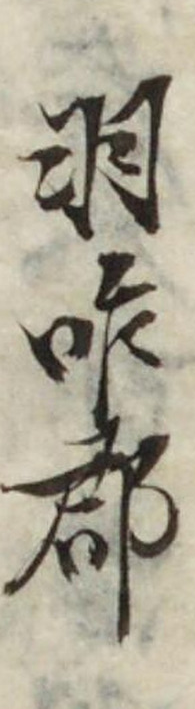羽咋郡
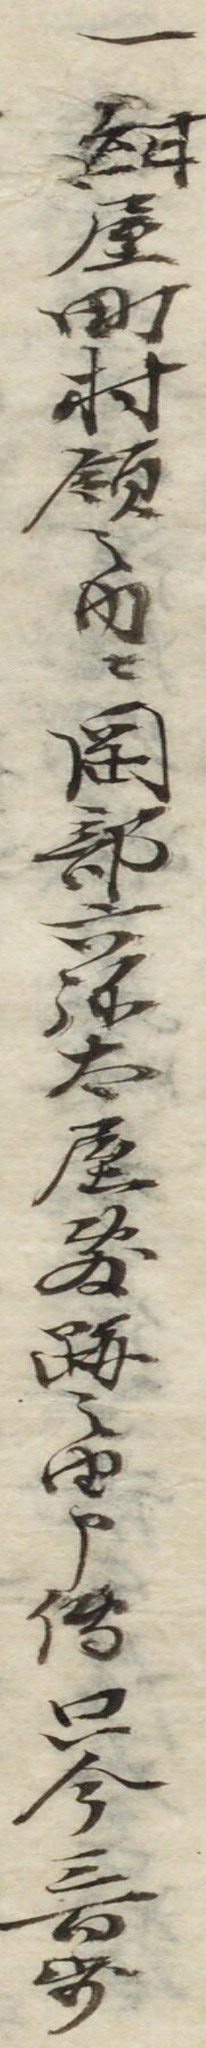一紺屋町村領之内ニ岡部六弥太屋敷跡之由申伝只今三百歩
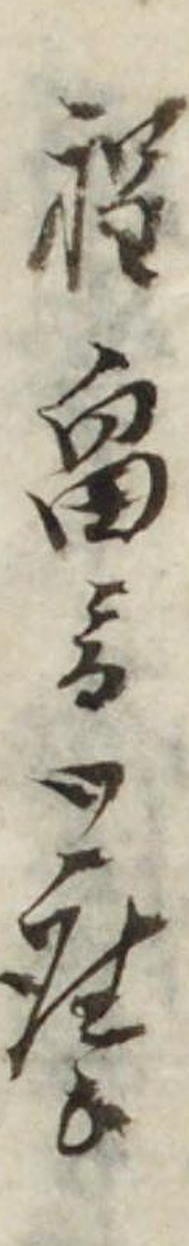程畠ニ而御座候
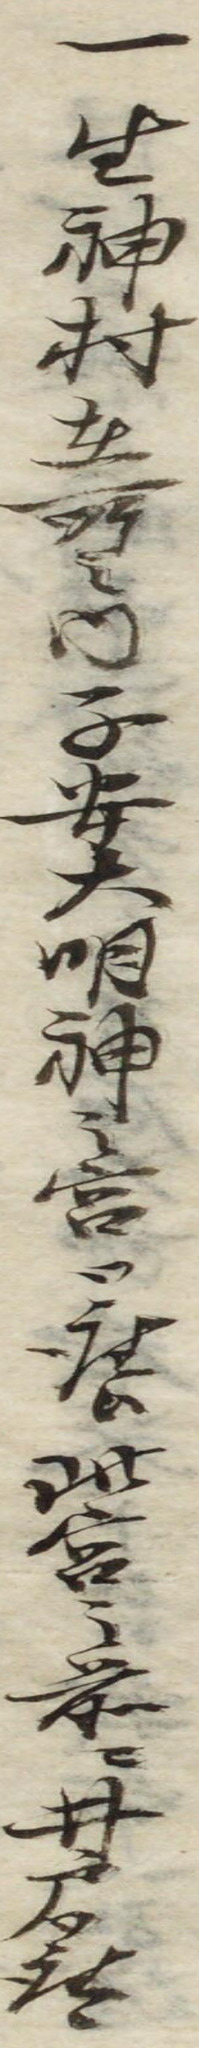一生神村在所之内子安大明神之宮御座候此宮之前に井戸御座候
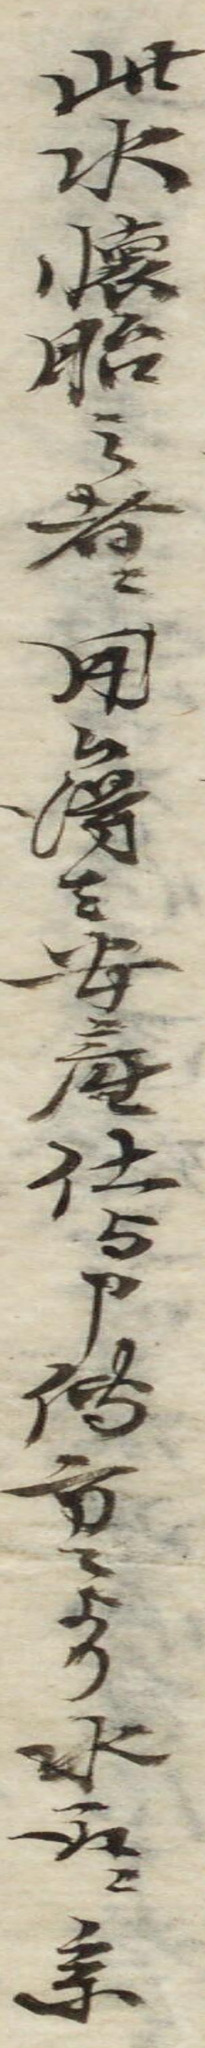此水懐胎之者に用候得は安産仕と申伝方々より水取に参
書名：加越能旧聞録
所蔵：Ishikawa Prefectural Library
